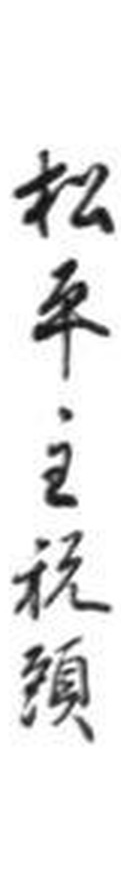松平主税頭
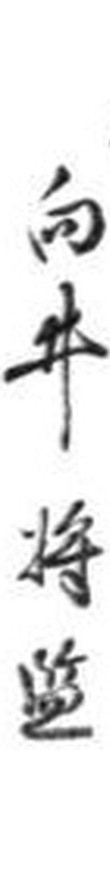代向井将監
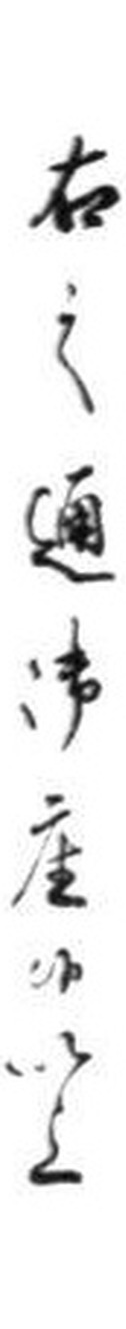右之通御座候以上
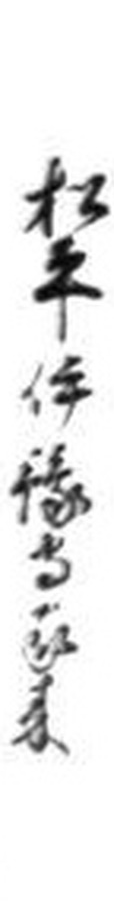松平伊予守名代
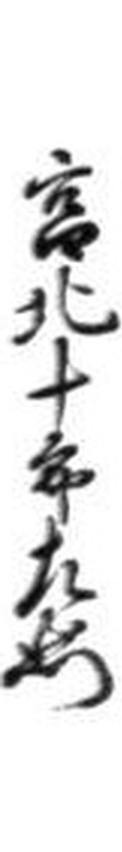宮北十郎左衛門
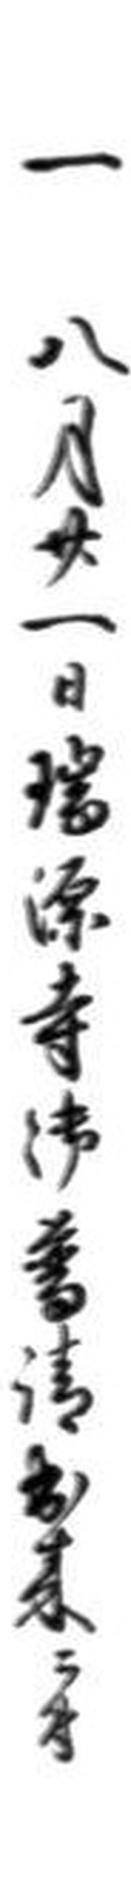一八月廿一日瑞源寺御普請出来ニ付
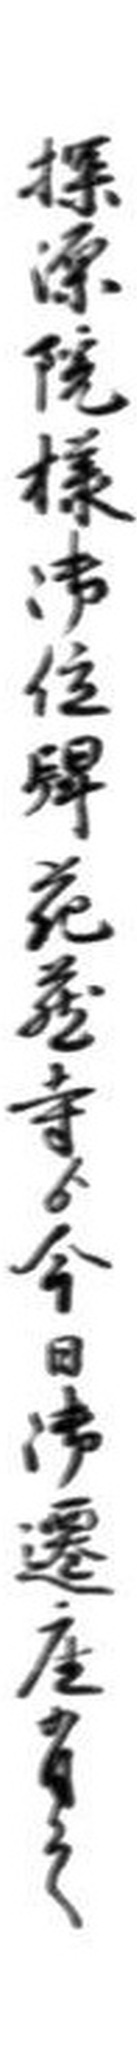探源院様御位牌花蔵寺ゟ今日御遷座有之
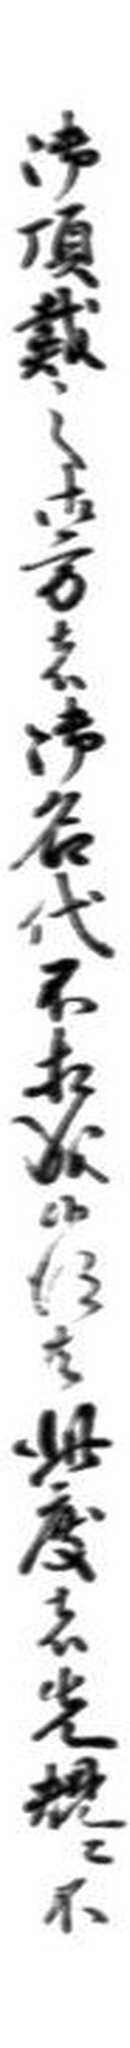御頂戴之御方者御名代不相成候得共此度者先規ニ不
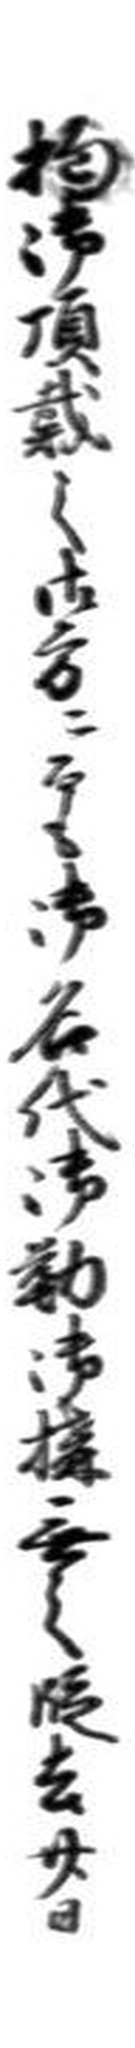拘御頂戴之御方ニ而も御名代御勤御構無之段去廿日
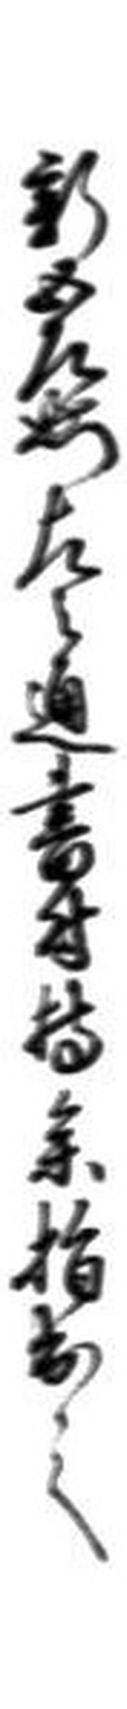新五左衛門左之通書付持参指出之
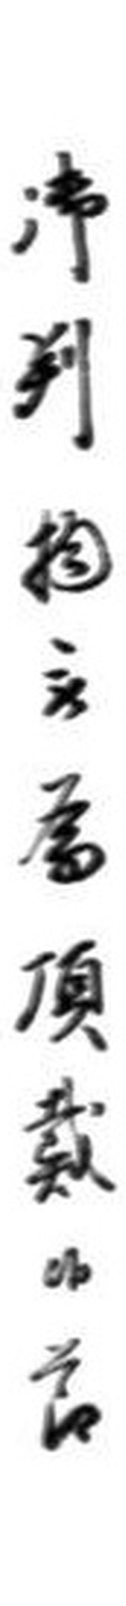御判物被為頂戴候節

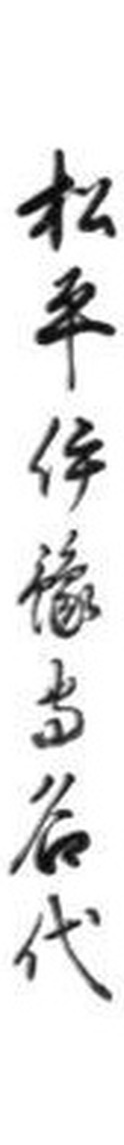松平伊予守名代
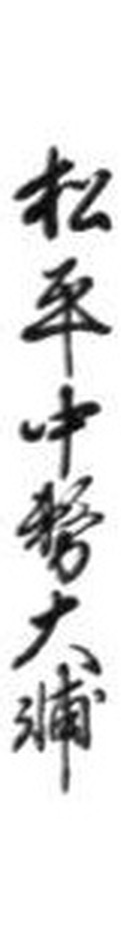松平中務大輔
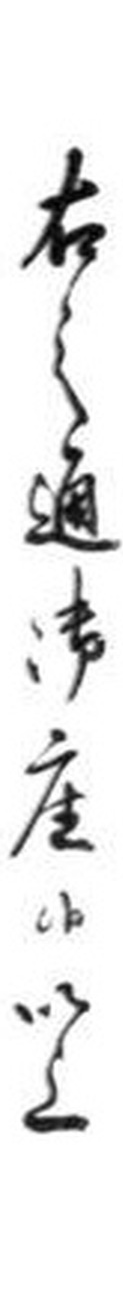右之通御座候以上
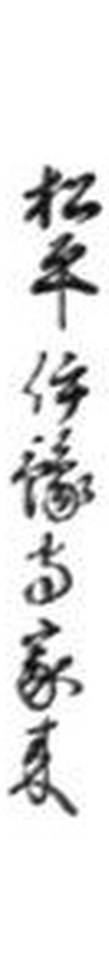松平伊予守家来
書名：家譜 三十二 吉邦公 従享保二年到享保三年
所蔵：福井県文書館 Fukui Prefectural Archives
